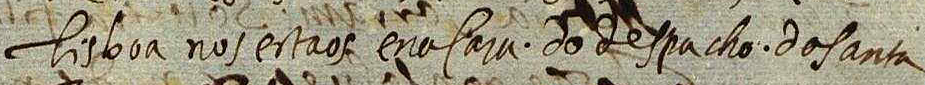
lisboa nos estaos e na Caza do despacho da santa
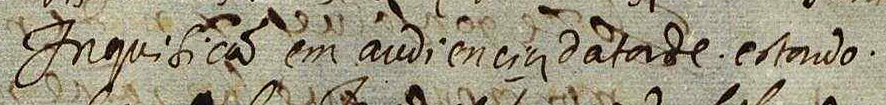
Jnquisição em audiencia da tarde. estando
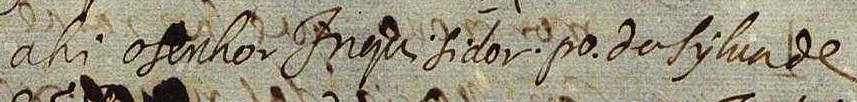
ahi o senhor Jnquisidor po. da Sylua de
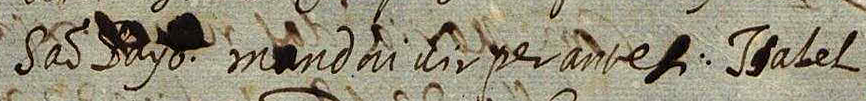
Saõ Payo mandou uir perante si Isabel
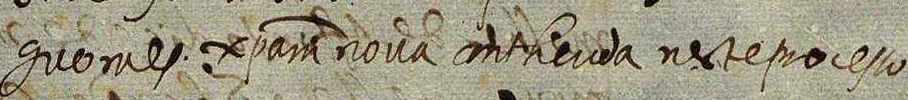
guomes xpam noua contheuda neste processo
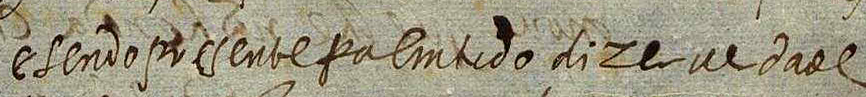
e sendo presente ꝑa em tudo dizer uerdade
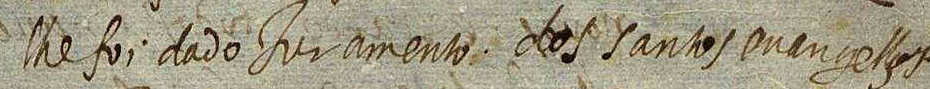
lhe foi dado Juramento dos santos euangelhos
